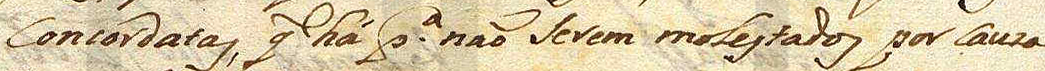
Concordatas, q̄ há p.a naõ serem molestados por cauza
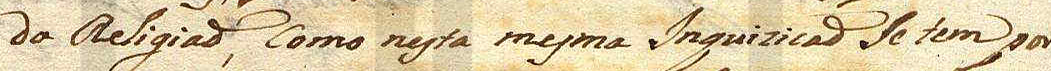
da Religiaõ, como nesta mesma Inquizicaõ se tem por
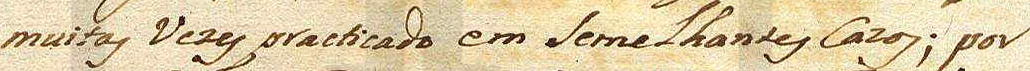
muitas Vezes practicado em semelhantes Cazos; por
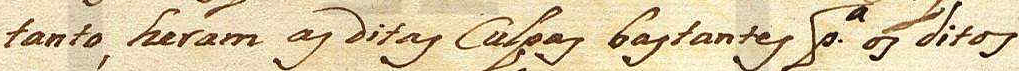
tanto, heram as ditas Culpas bastantes p.a os ditos
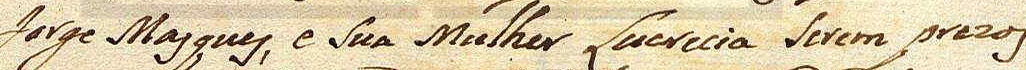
Jorge Masques, e sua mulher Lucrecia serem prezos
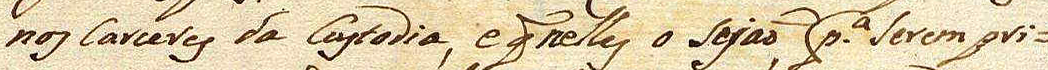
nos carceres da Custodia, e q̄ nelles o sejaõ, p.a serem pri
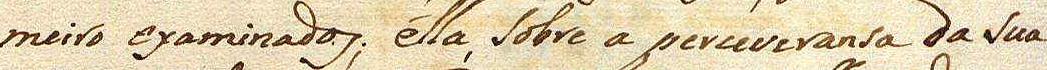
meiro examinados; ella, sobre a perceveransa da sua
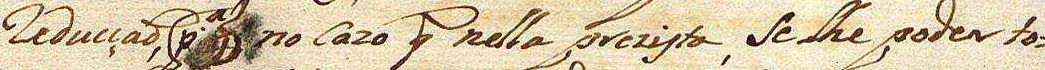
Reducçaõ p.a _ no Cazo q̄ nella prezista, se lhe poder to
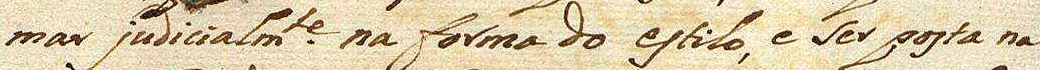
mar judicialm.te na forma do estilo, e ser posta na
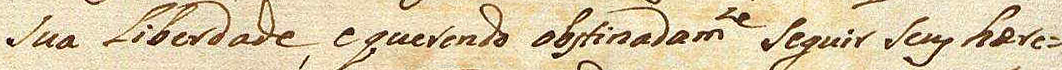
sua Liberdade, e querendo obstinadam.te seguir seus here
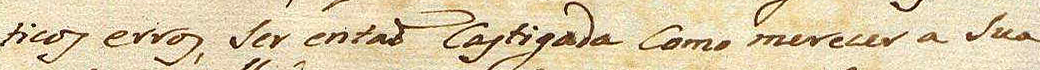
ticos erros, ser entaõ castigada como merecer a sua
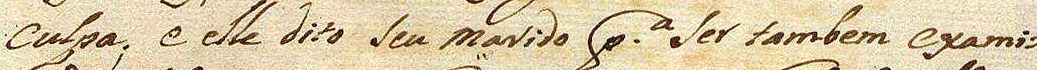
culpa; e elle dito seu marido p.a ser tambem exami
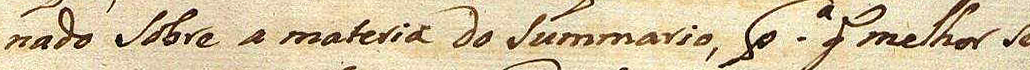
nado sobre a materia do summario, p.a q̄ melhor se
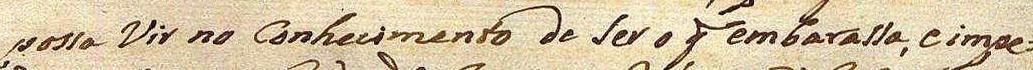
possa vir no conhecimento de ser o q̄ embarassa, e impe
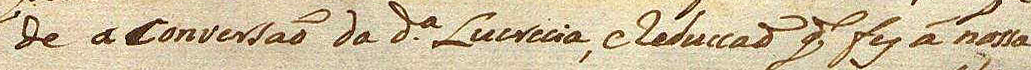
de a conversaõ da d.a Lucrecia, e Reduccaõ q̄ fes á nossa
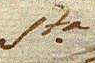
st.a
